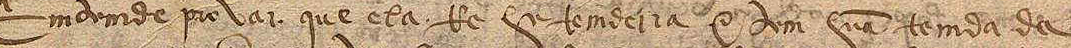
Emtemde provar. que ela. Re he temdeira e tem hūa temda da
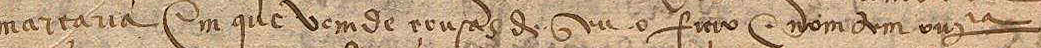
marçaria em que vemde çousas de seu ofiçio e nom tem outra
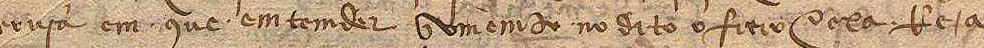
cousa em . que . emtemder somemte no dito oficio e ela. Re ja
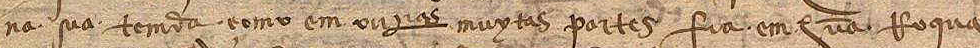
na sua temda . çomo em outras muytas partes fia . em hūa Roqua
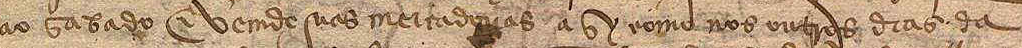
ao sabado e vemde suas mercadorias asy como nos outros dias da
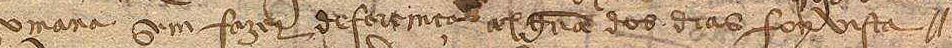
somana sem fazer deferemça algūa dos dias foy vista //
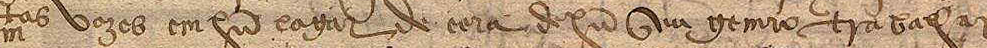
muytas vezes em hū lagar de cera de hū seu gemro trabalhar
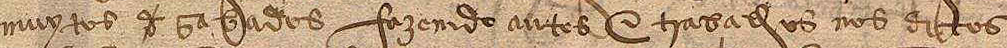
muytos d sabados fazemdo autos e trabalhos nos ditos
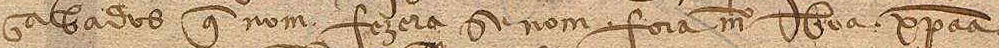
sabados q̄ nom fezera se nom fora mto boa x̄paa
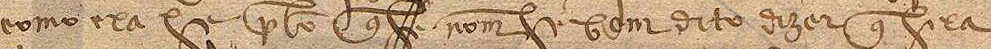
como ela he p̄lo q̄ he nom he bem dito dizer q̄ hela
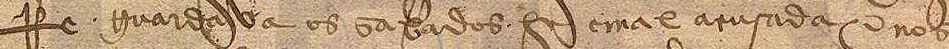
Re . guardava os sabados he e mal acusada e nos
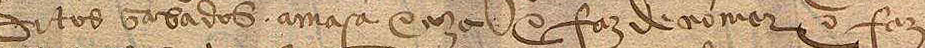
ditos sabados . amasa e coze e faz de comer e faz
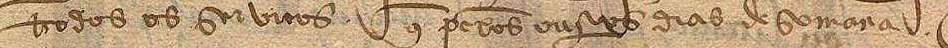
todos os servicos q̄ pēlos outros dias de somana
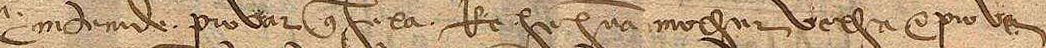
Emtemde . provar q̄ hela Re he hūa molher velha e prove
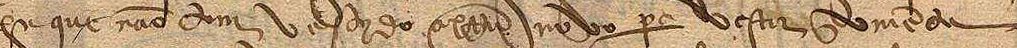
he que não tem vestydo algū novo ꝑa vestir somēte
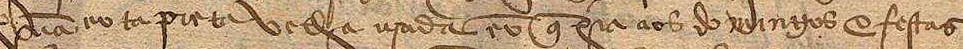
hūa cota preta velha usada c̄o q̄ hia aos domingos e festas
